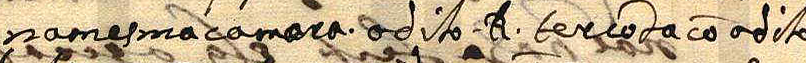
na mesma camara. o dito .R. ter cōta cō o dito
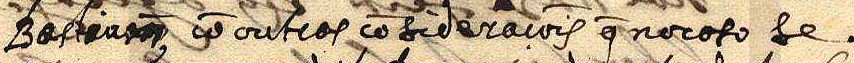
Bastiam, cō outras cōsideraçõis q̄ no caso se
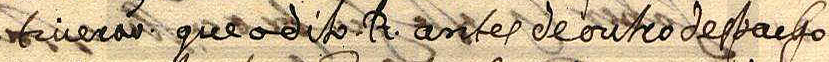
tiueraõ que o dito .R. antes de outro despacho
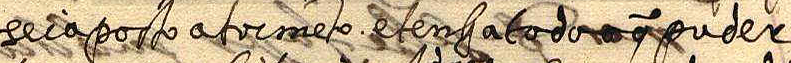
seia posto a tormēto. e tenha todo o q̄ puder
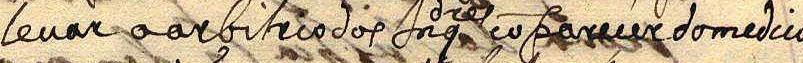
leuar o arbitrio dos Jnqdres cō pareçer do medico
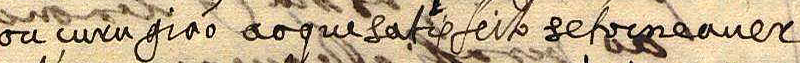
ou çurugiaõ ao que satisfeito se torne a uer
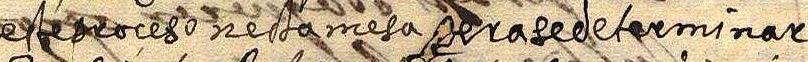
este proçeso nesta mesa pera se determinar
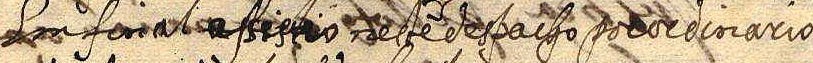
Em final assistio neste despacho por ordinario
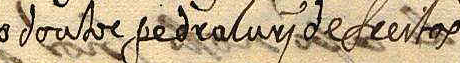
o doutor pedralurs̄ de freitas.
